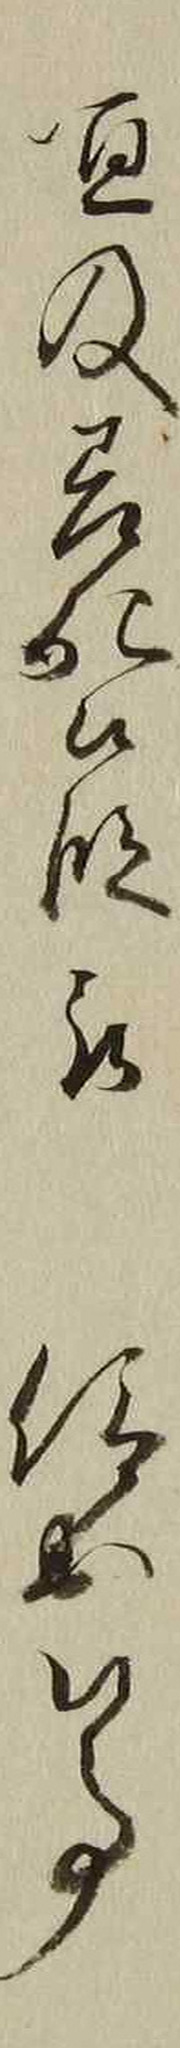宜及差配候段被仰出候事
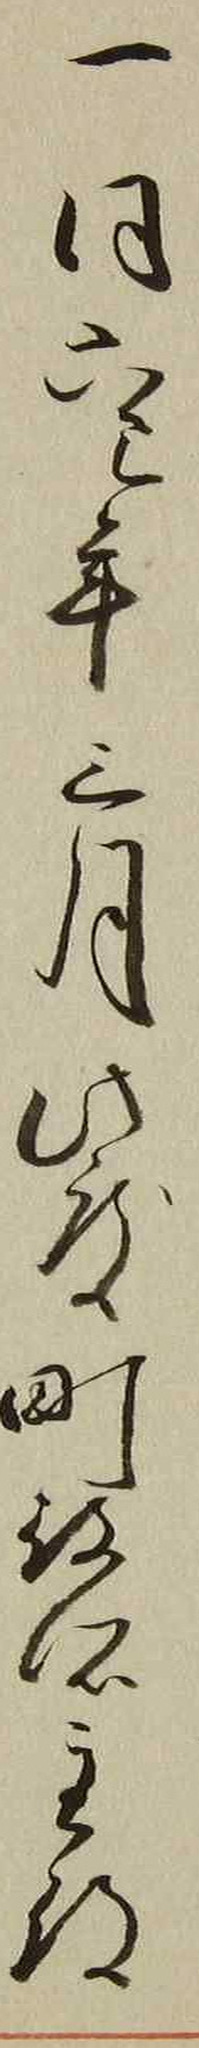一同六巳年三月此度町役所主役
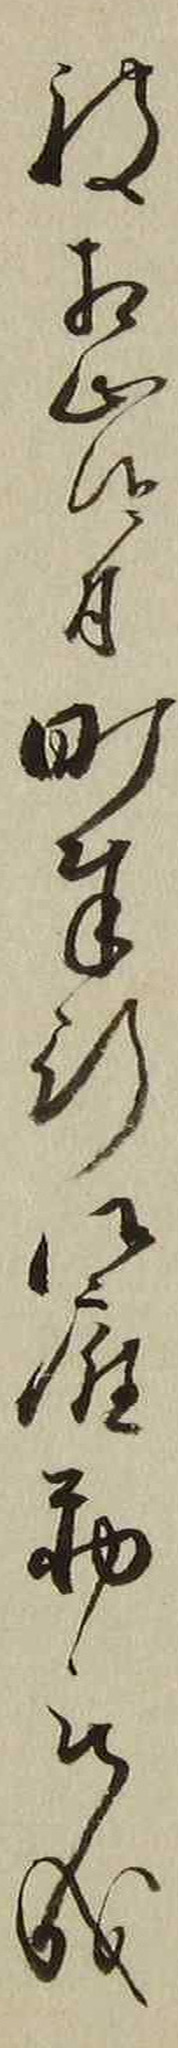被相止候ニ付町奉行御雇勤被成
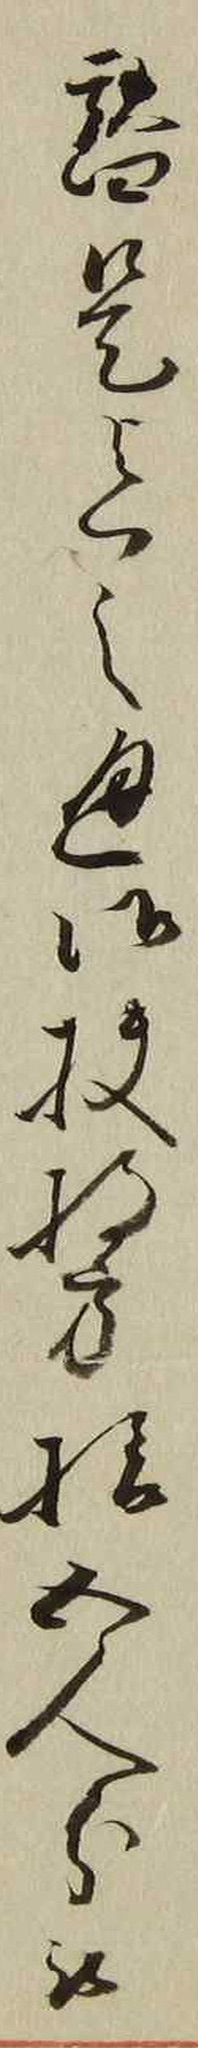是迄之通御扶持方拾五人分被
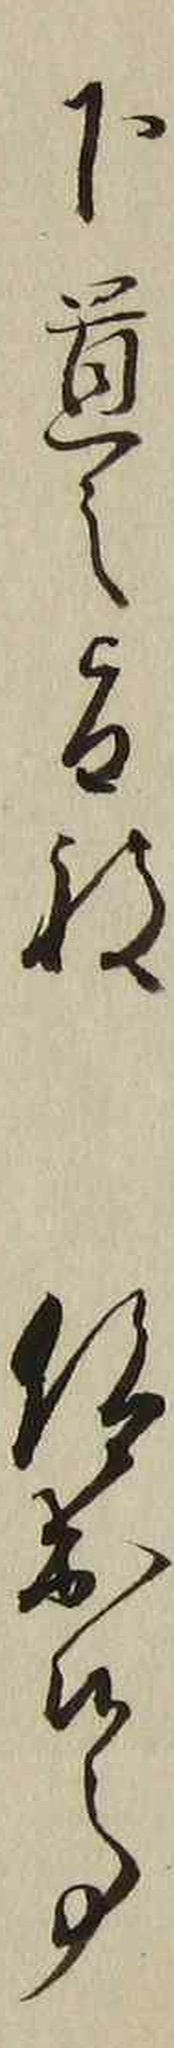下置之旨被仰出候事
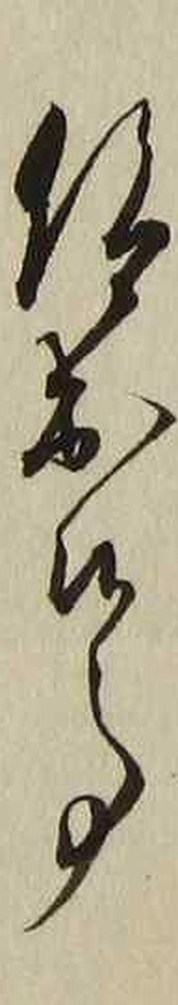仰付候事
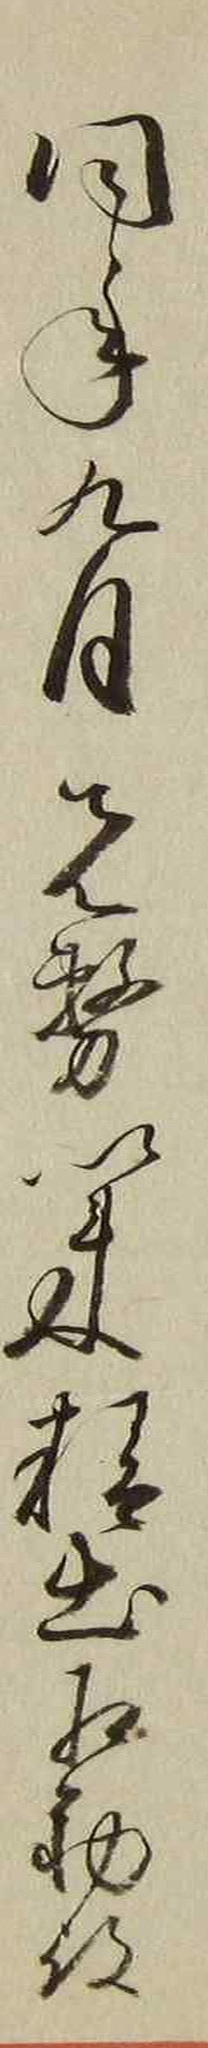一同年九月先務以来精出相勤役
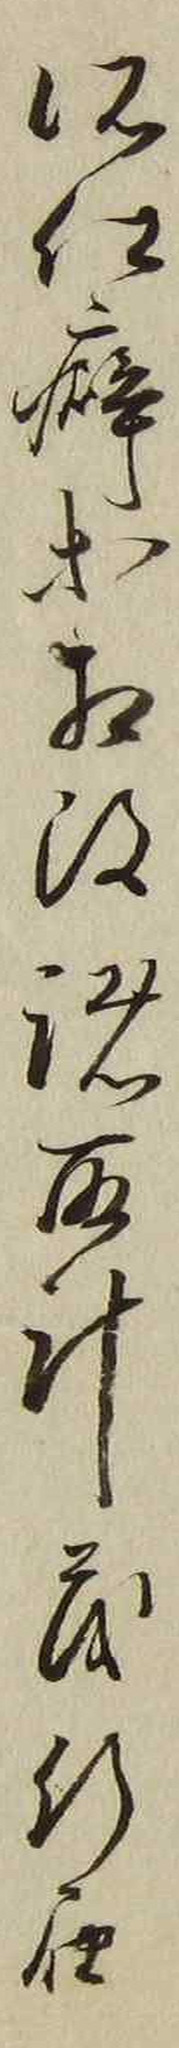所仕癖等相役諸取計も行届
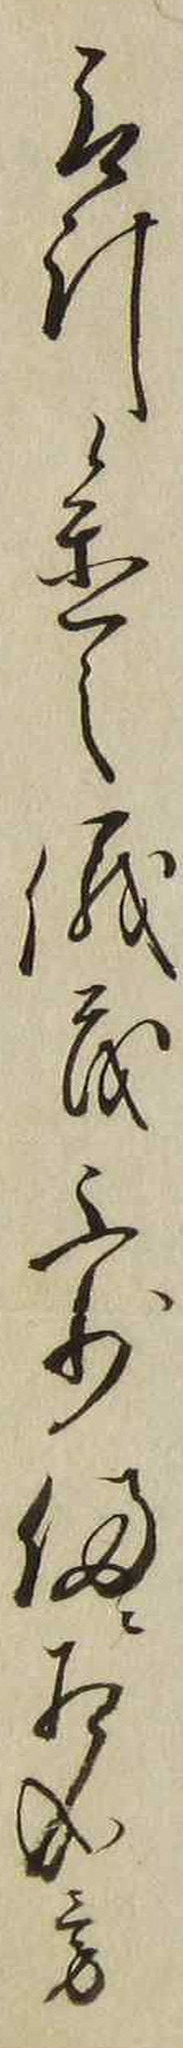取計置之儀も不少備ニ相成旁

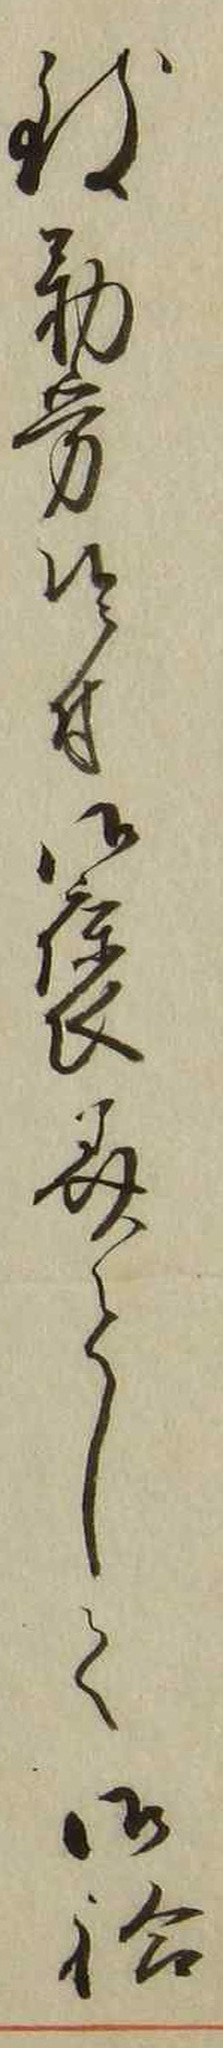致勤労候ニ付御褒美として御袷
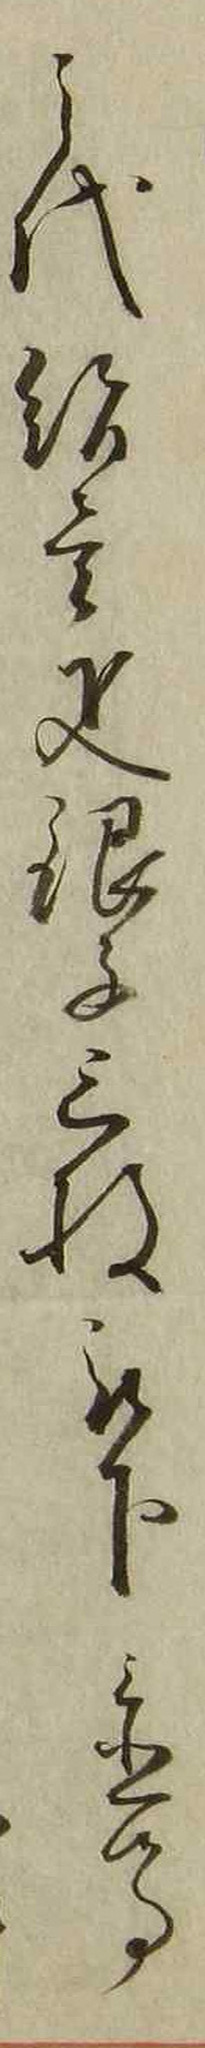之代絹壱疋銀子三枚被下置候事
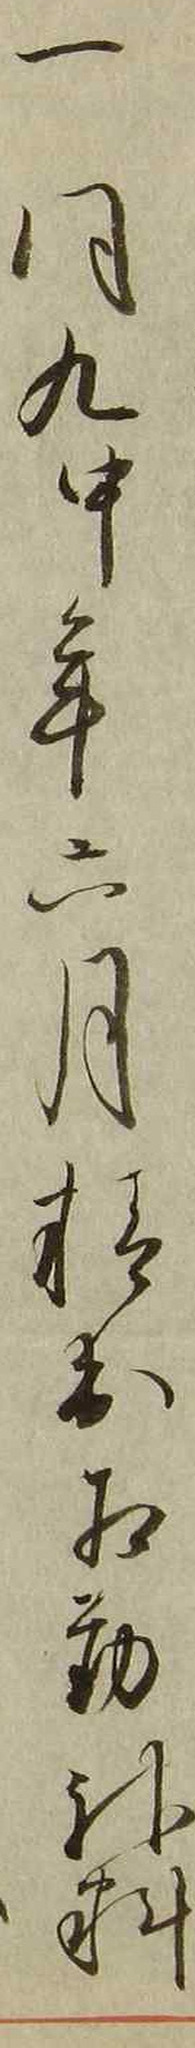一同九申年六月精出相勤神料
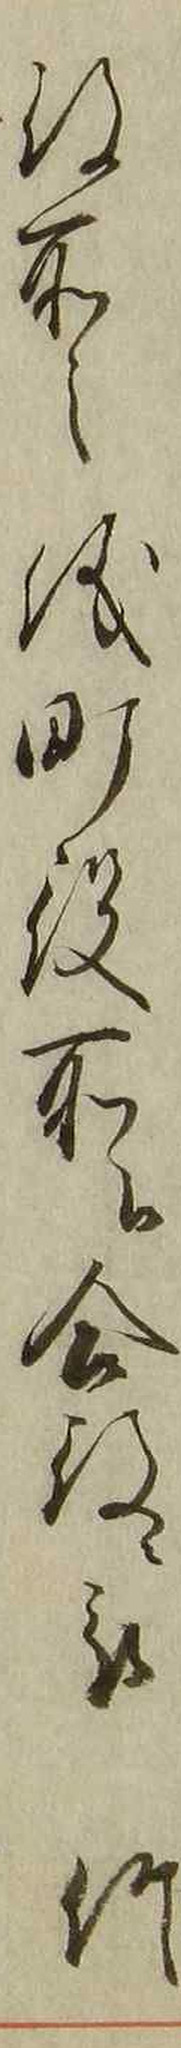役所之儀町役所江合役ニ被仰
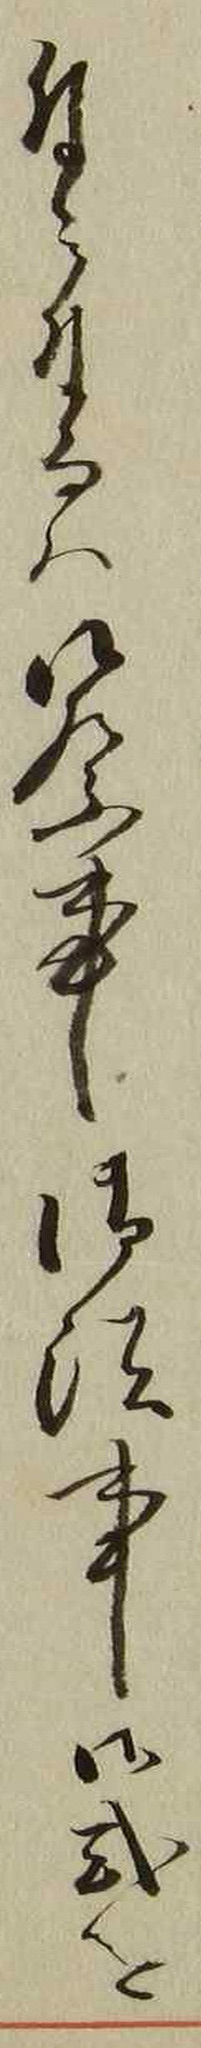付候ニ付而ハ御祭事御法事御式を
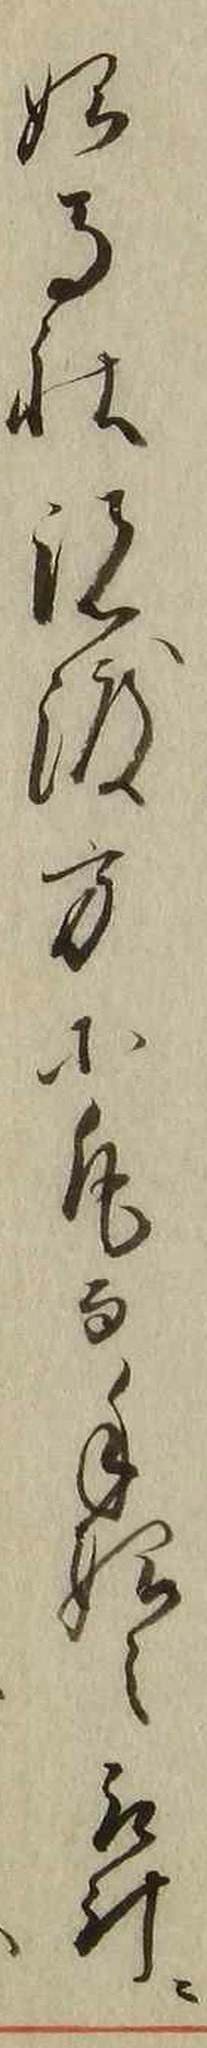始寺社諸渡方等凡而年始之取計ニ
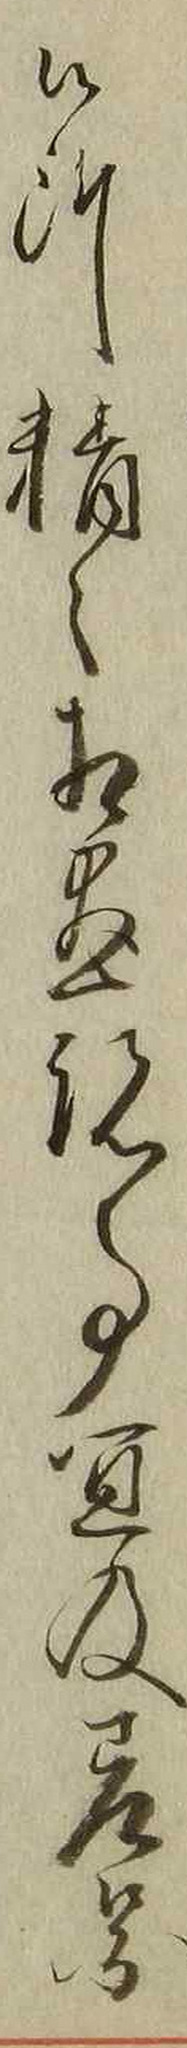候所精々相諸事宜及差図
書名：諸士系譜　巻之2　い之部2
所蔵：会津若松市立会津図書館
